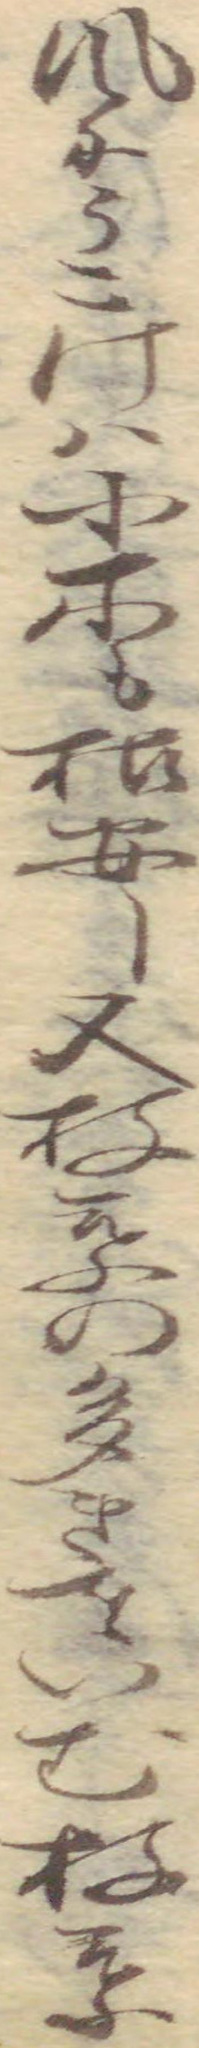風にうこけハ小木も枯安し又枝葉の多きをいむ枝葉
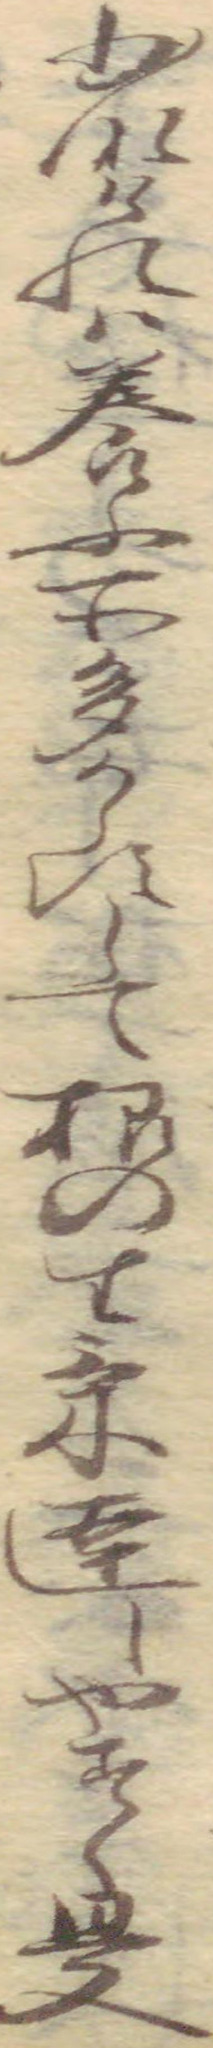少なけれハ養ふ所多からすして根の生気達しやすく且又
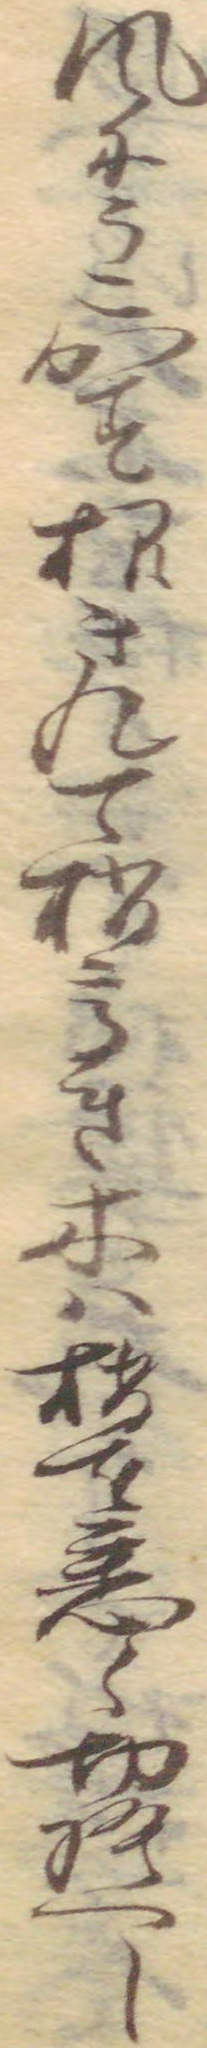風にうこかす根きれて梢高き木ハ梢を悉く切捨へし

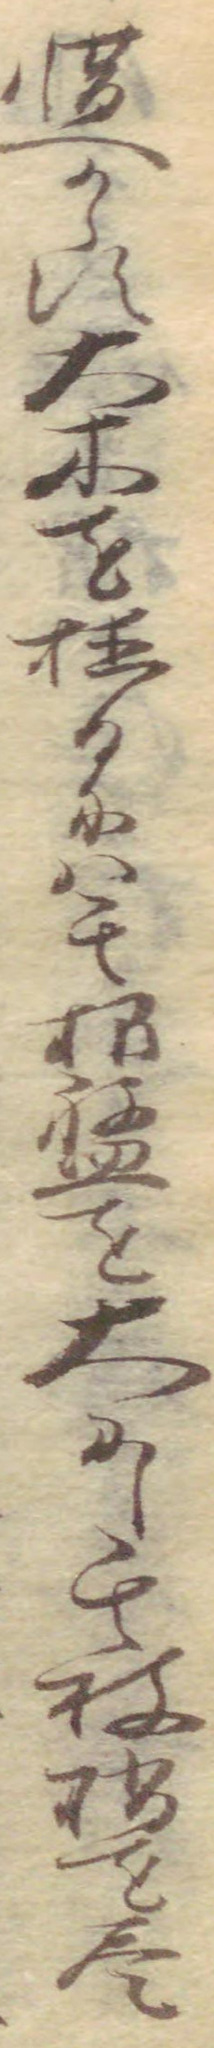惜へからす大木を植るにハ其根盤を大にし其枝梢を尽
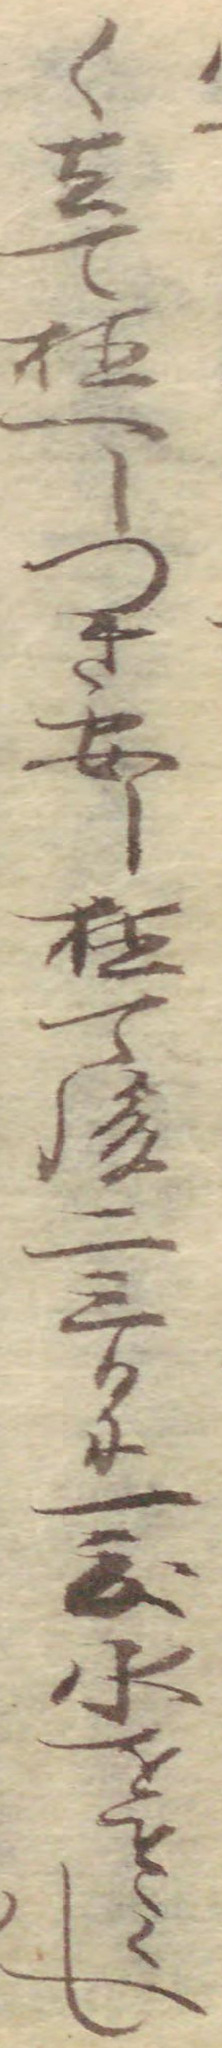く去て植へしつき安し植て後二三日に一度水をそゝくへし
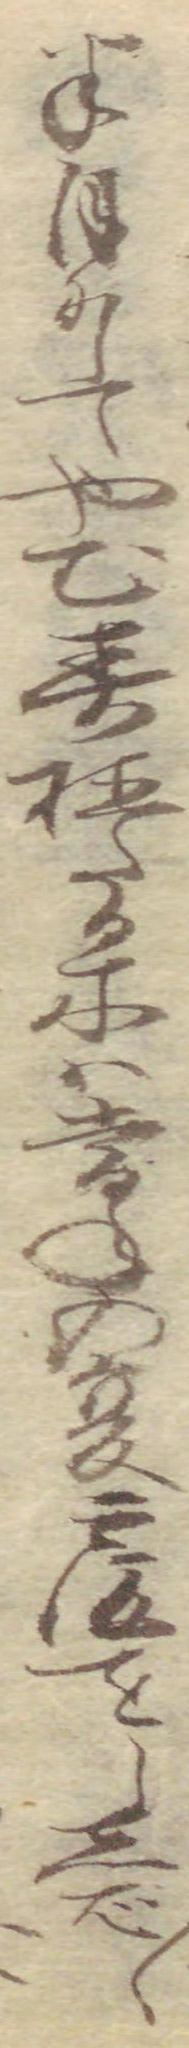半月にしてやむ春植たる木ハ当年の夏覆をししば〳〵
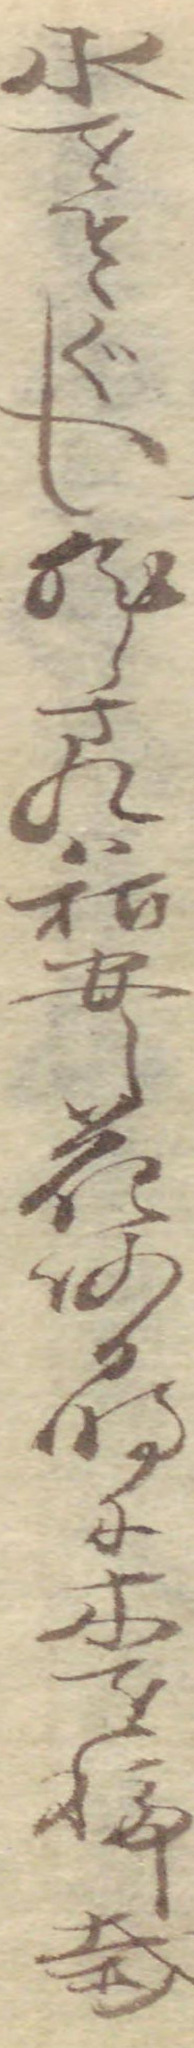水をそゝぐへし然らされハ枯安し花ある時に木を移し栽
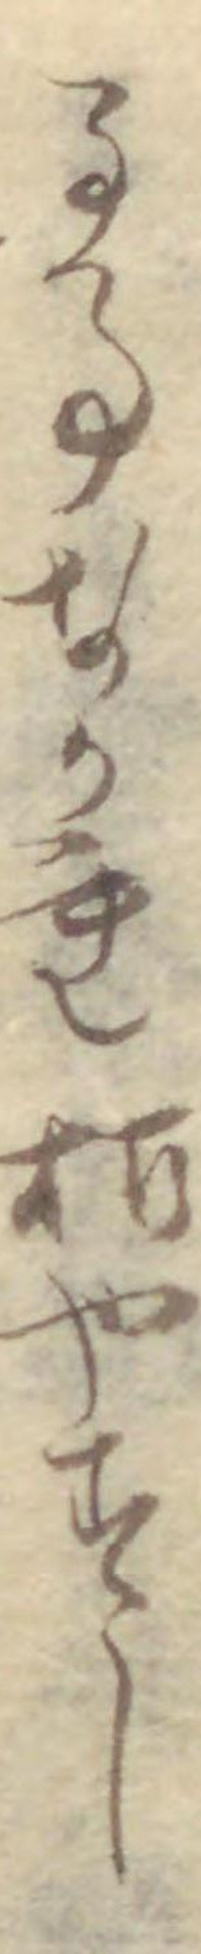る事なかれ枯やすし
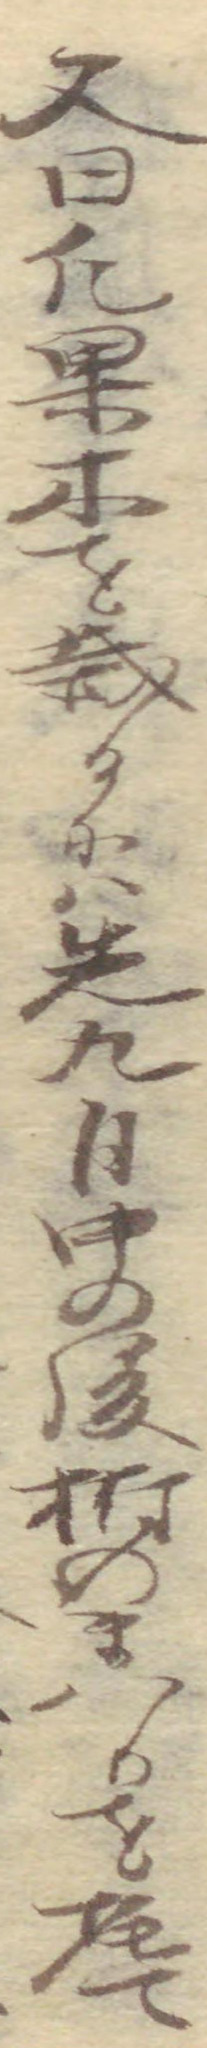一父曰凡果木を栽るにハ先九月中の後樹のまハりを堀て
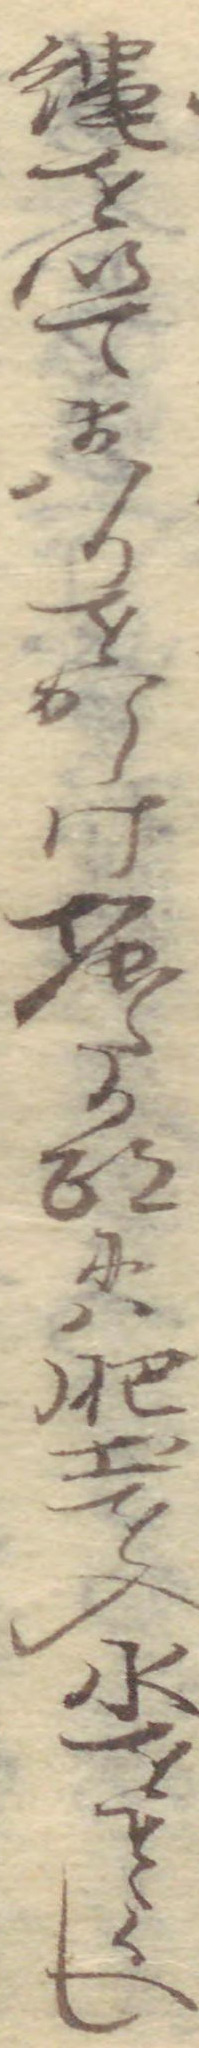縄を以てまハりをからけ堀たる跡にハ肥土を入水をそゝくへし
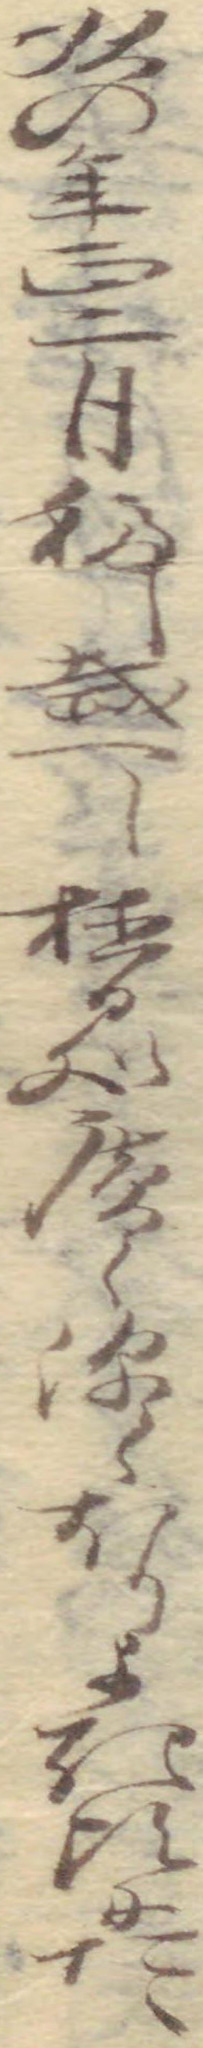次の年正二月移し栽へし植る処広く深くほりよき頃にたゝ
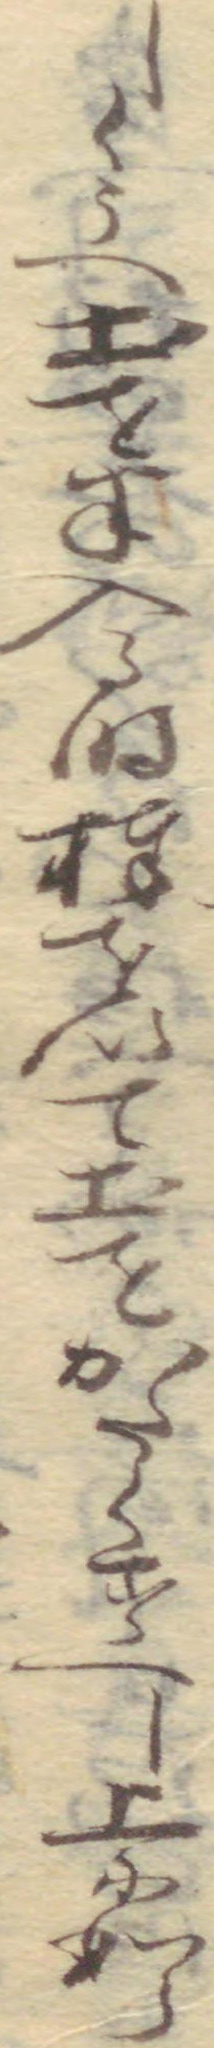しくうへ土を半入る時棒を以て土をかたくすへし上に和ら
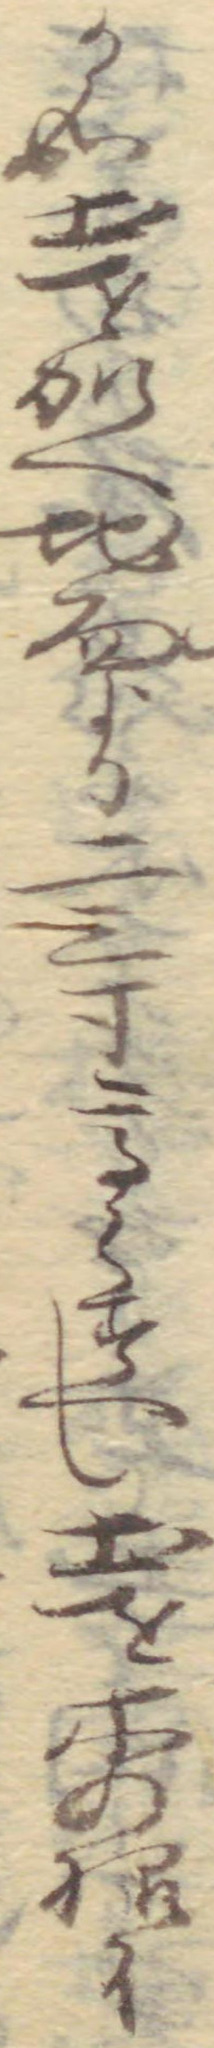か成土を加へ地面より二三寸高くすへし土を木の根に
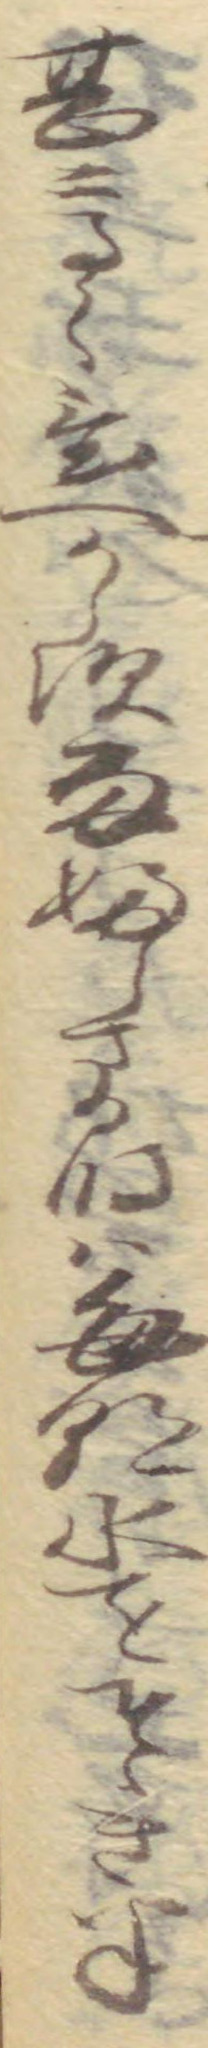甚高く置へからす雨ふらさる時ハ毎朝水をそゝき半
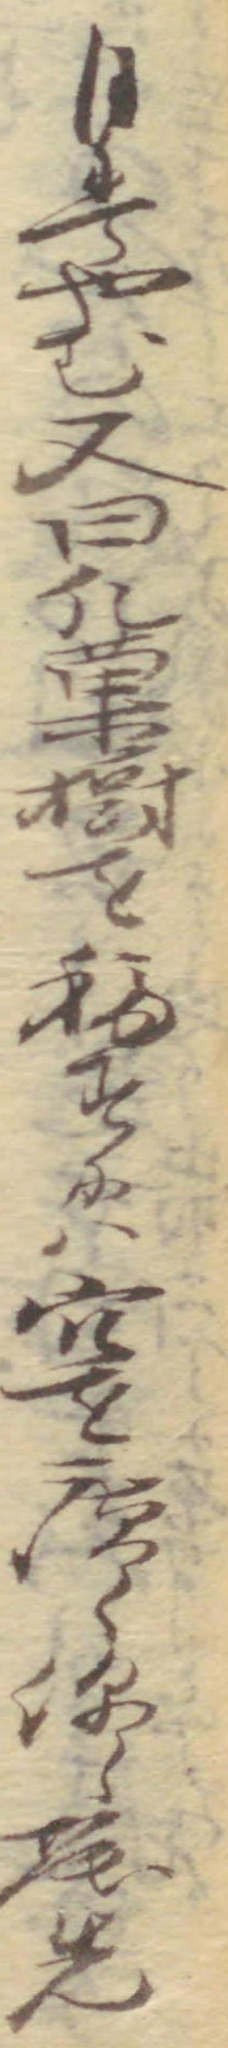月にてやむ又曰凡菓樹を移すには穴を広く深く堀先
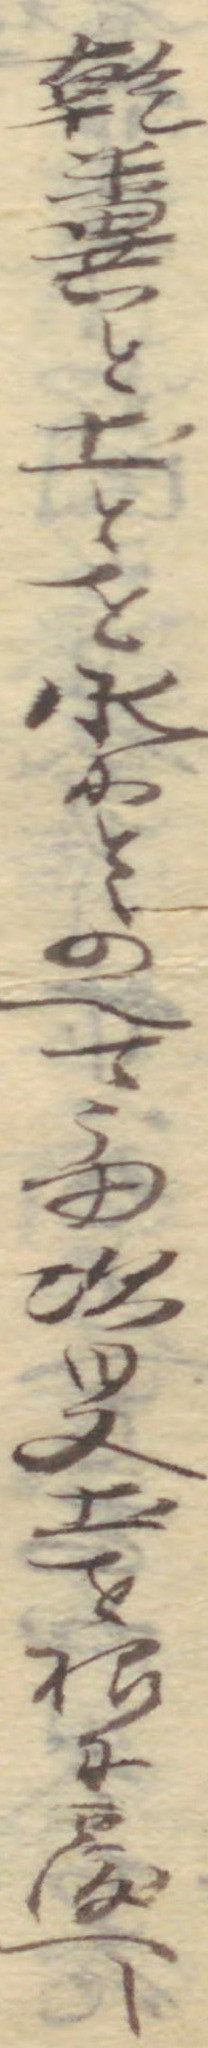乾糞と土とを水にとゝのへてうゆ次日又土を根に覆へし
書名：鶯宿雑記. 巻199-200
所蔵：国立国会図書館 National Diet Library, JAPAN
